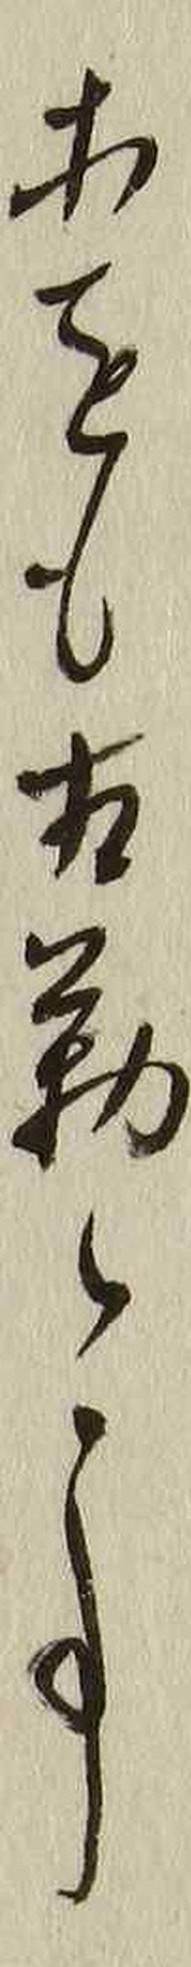等をも相勤候事
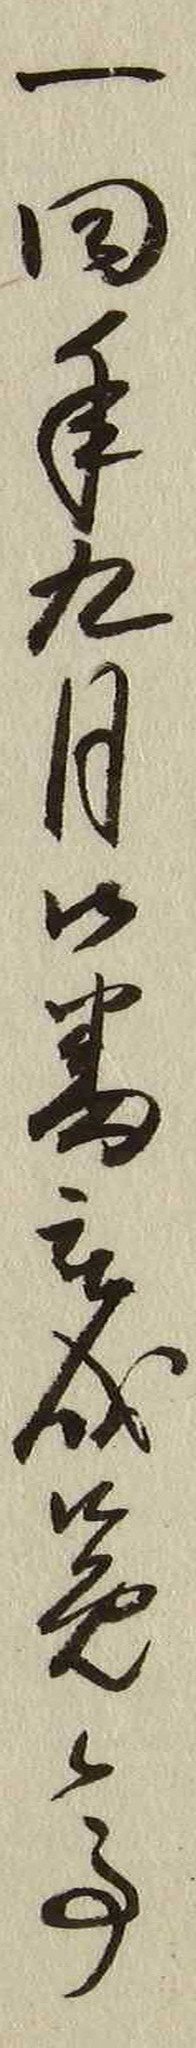一同年九月御番被成御免候事
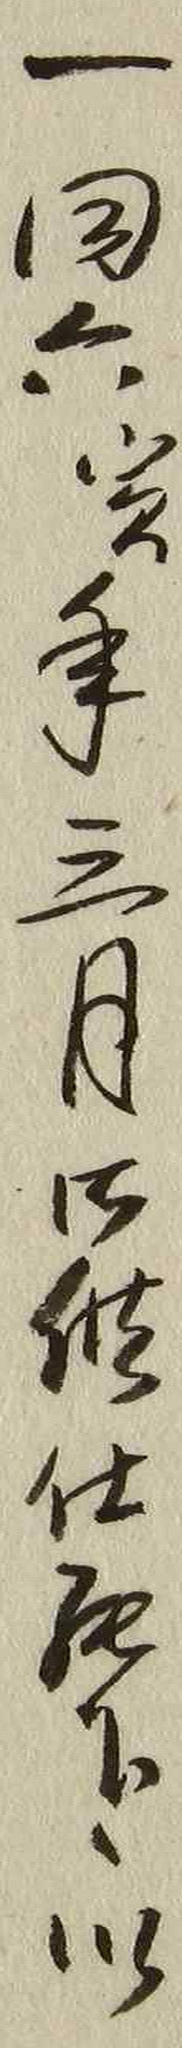一同六寅年三月御供仕罷下候以
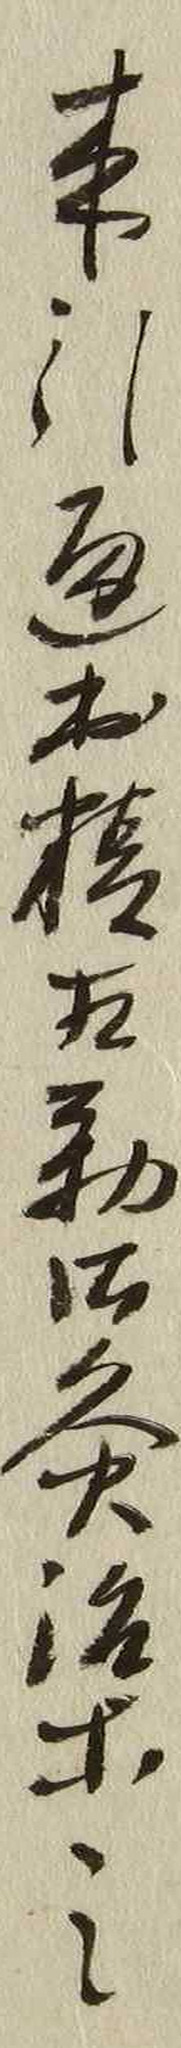来引通出精相勤御灸治等之
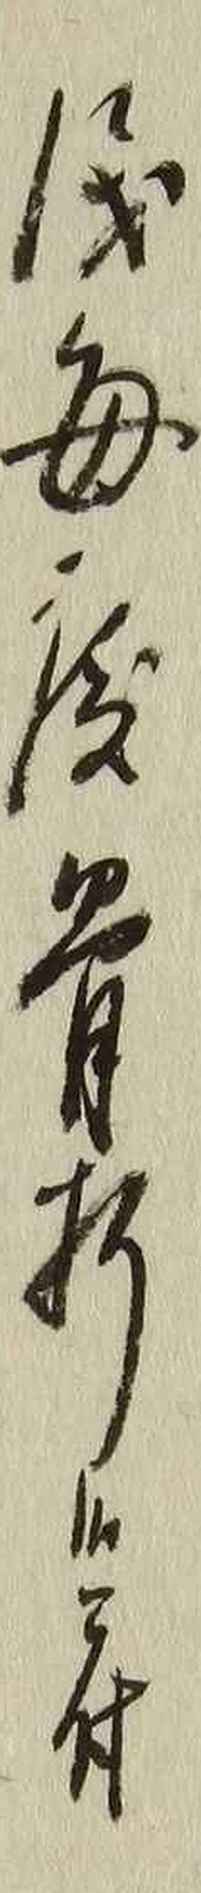儀毎度骨折候ニ付
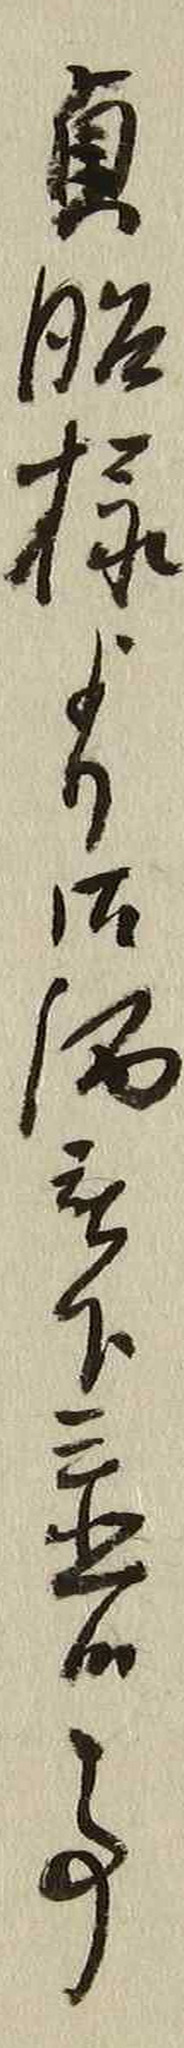貞昭様より御酒被下置候事
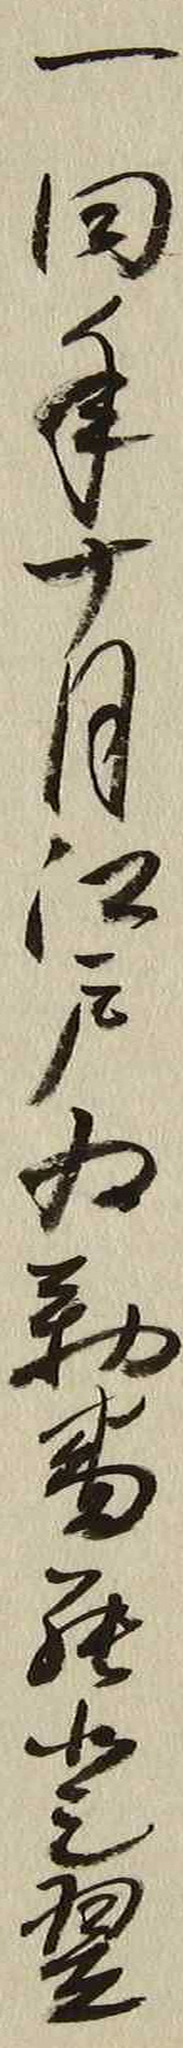一同年十月江戸為勤番罷登翌
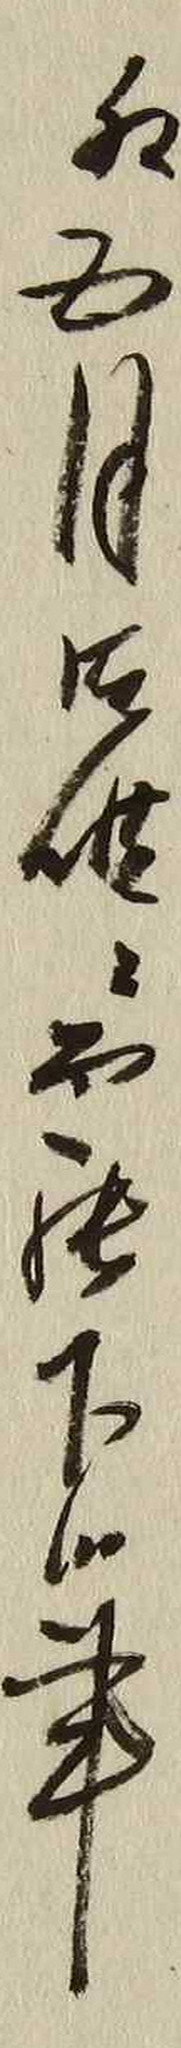卯五月御供ニ而罷下候事
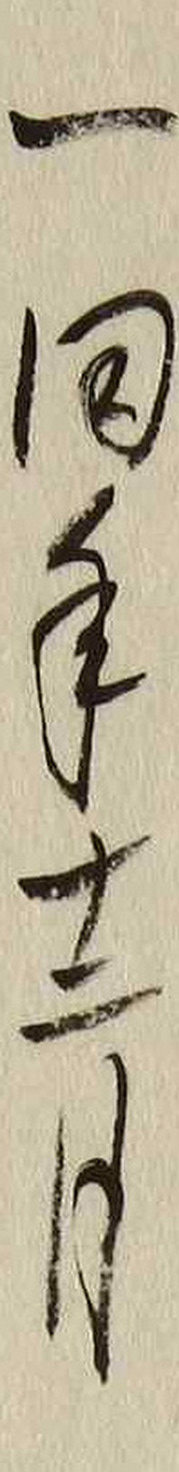一同年十二月
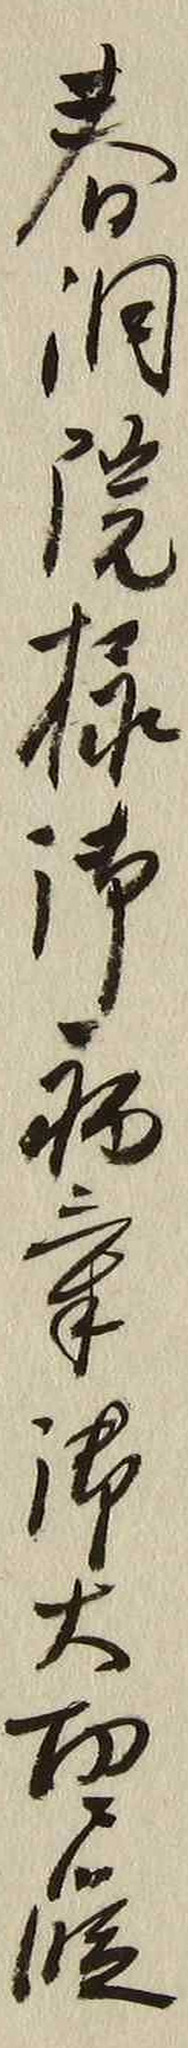春洞院様御病気御大切ニ候段
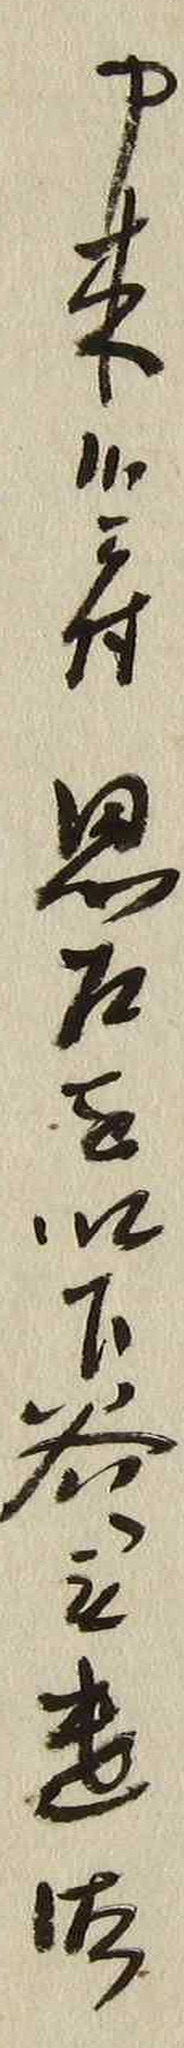申来候ニ付思召を以下谷へ被遣御
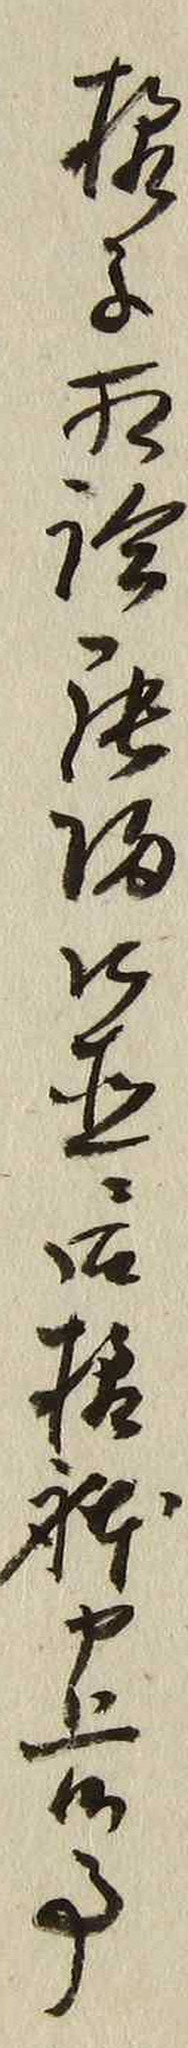様子相診罷帰御直ニ御様体申上候事
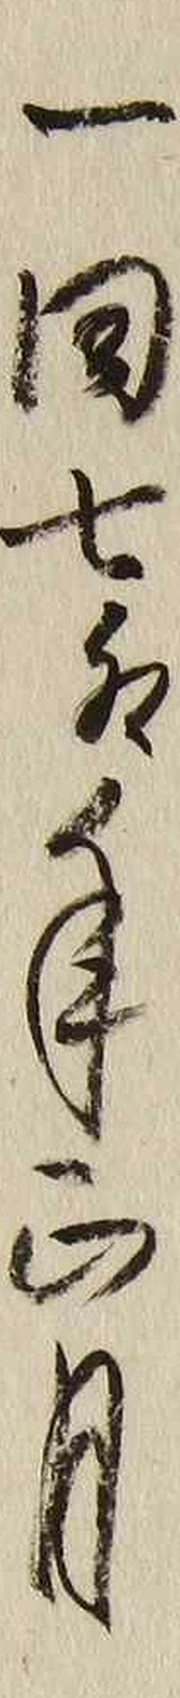一同七卯年正月
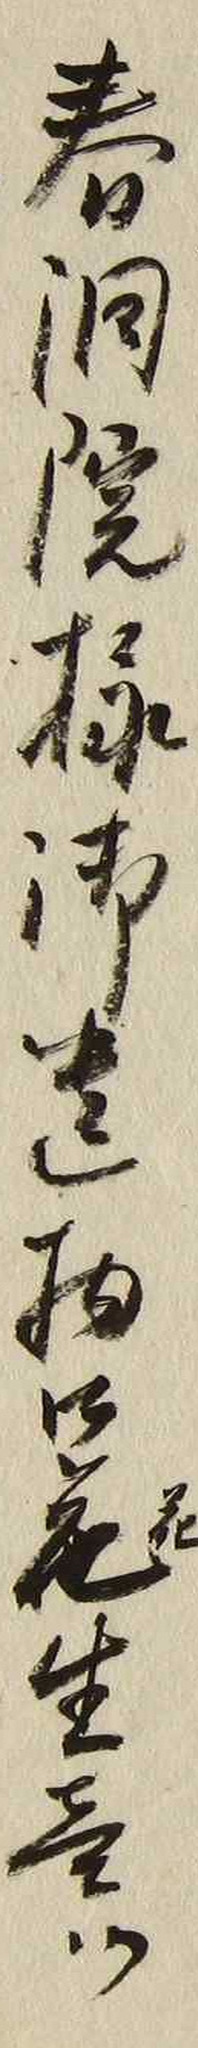春洞院様御遺物御花生壱ツ
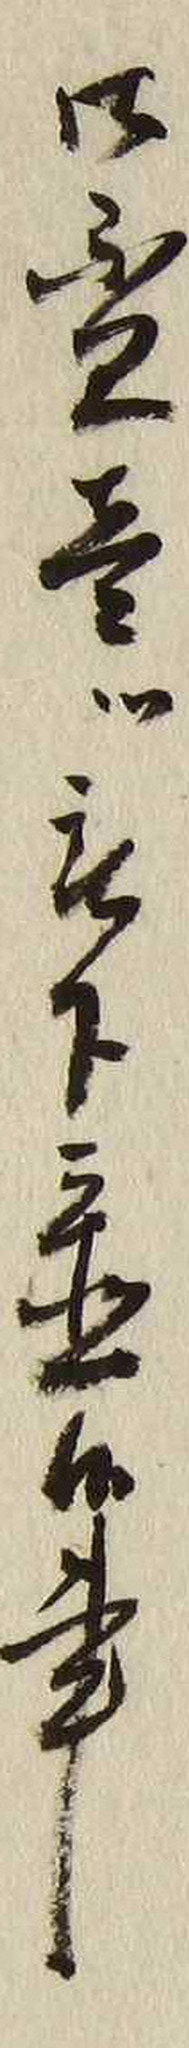御盃壱ツ被下置候事
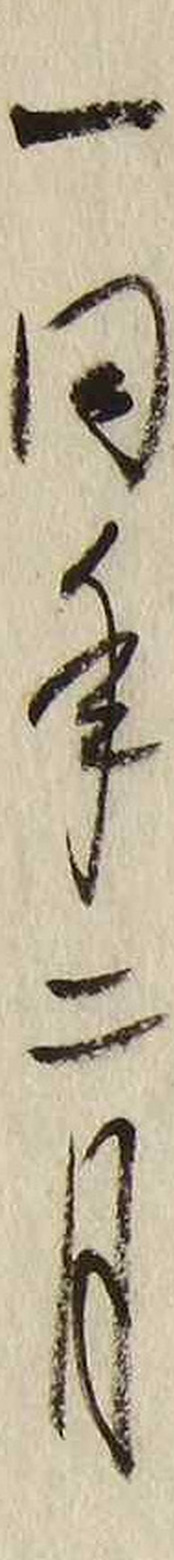一同年二月
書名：諸士系譜　巻之353　す之部3
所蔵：会津若松市立会津図書館
